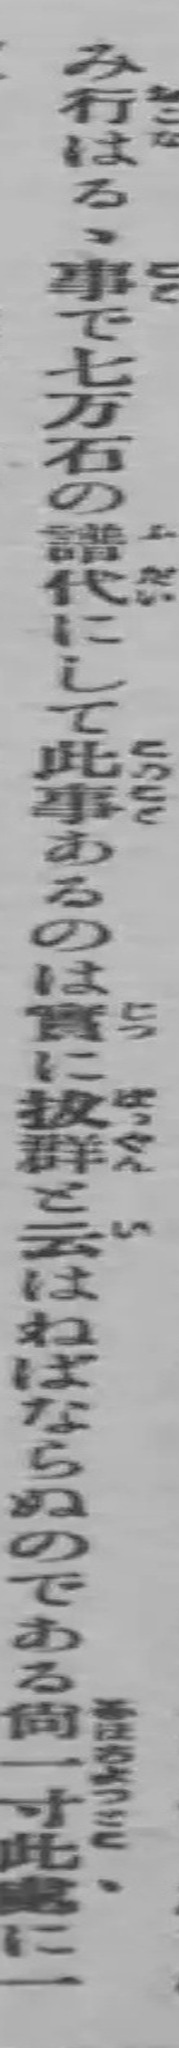み行はるゝ事で七万石の譜代にして此事あるのは実に抜群と云はねばならぬのである尚一寸此処に一
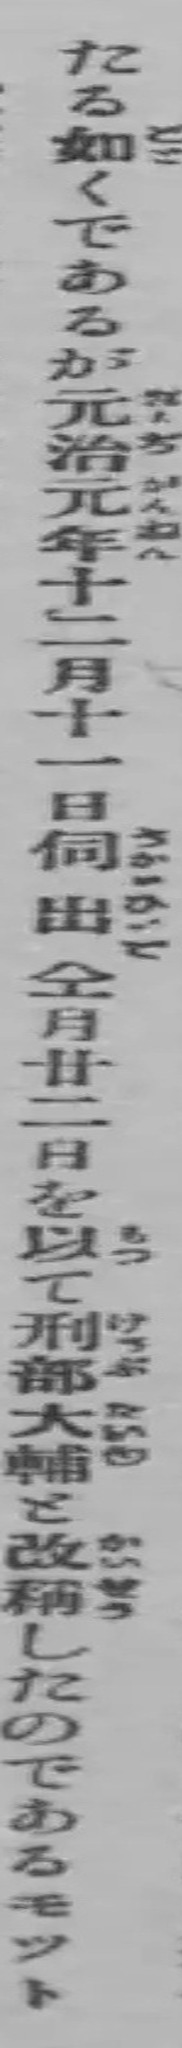たる如くであるが元治元年十二月十一日伺出仝月廿二日を以て刑部大輔と改称したのであるモツト
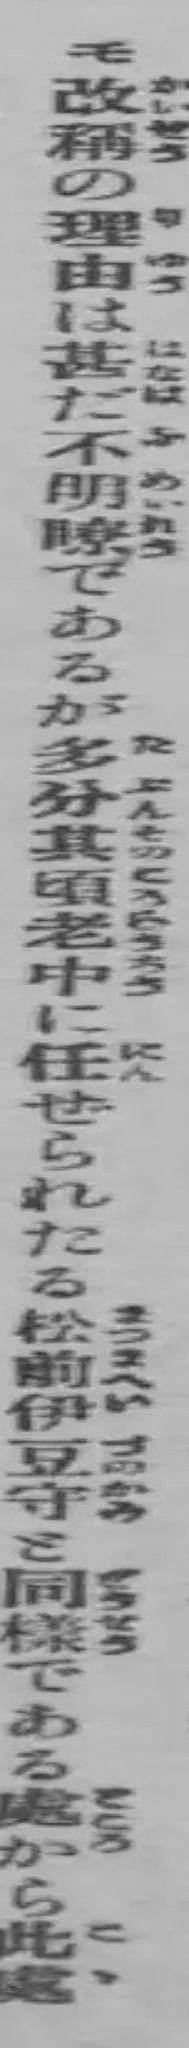モ改称の理由は甚だ不明瞭であるが多分其頃老中に任ぜられたる松前伊豆守と同様である処から此処
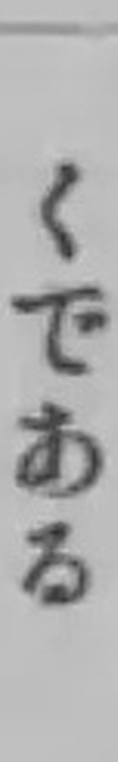くである
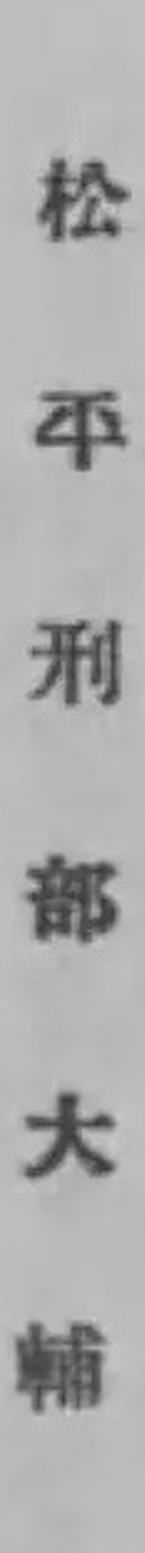松平刑部大輔
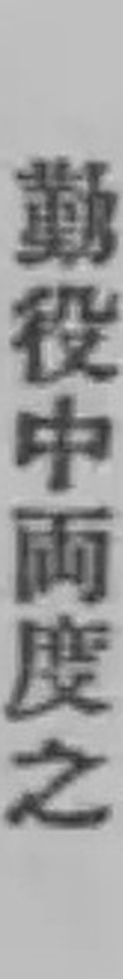勤役中両度之
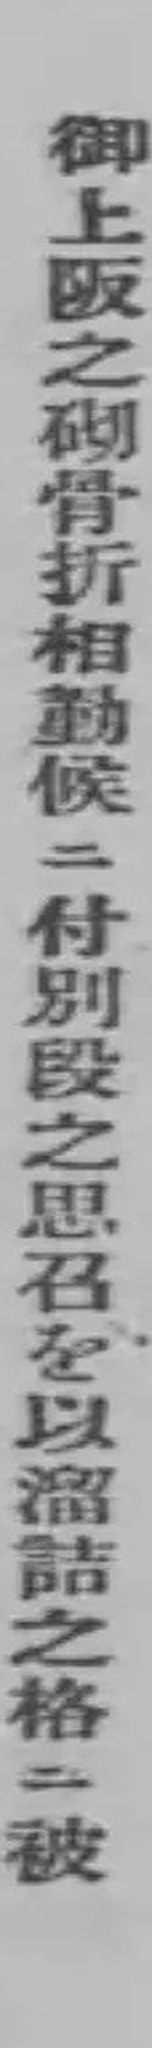御上阪之砌骨折相勤候ニ付別段之思召を以溜詰之格ニ被
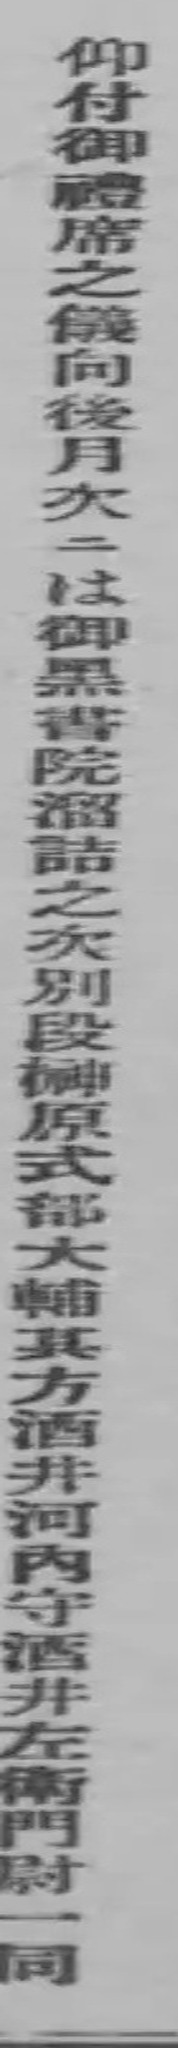仰付御礼席之儀向後月次ニは御黒書院溜詰之次別段榊原式部大輔其方酒井河内守酒井左衛門尉一同
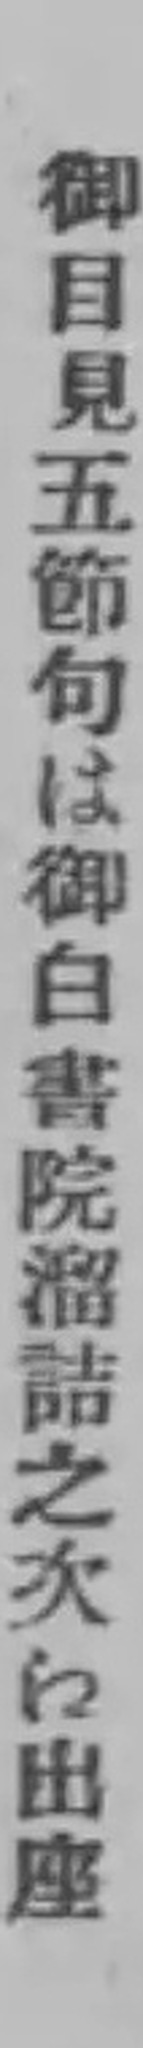御目見五節句は御白書院溜詰之次え出座
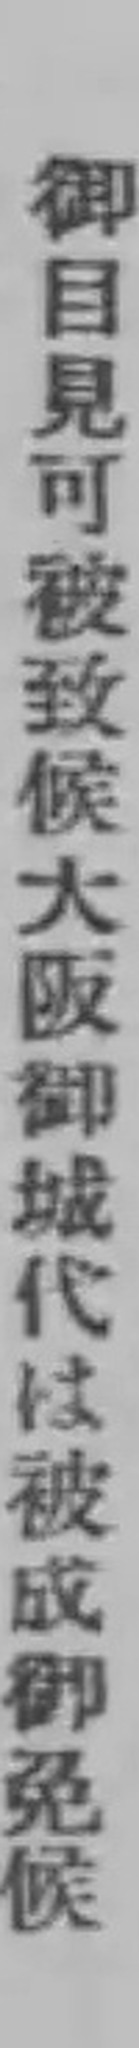御目見可被致候大阪城代は被成御免候
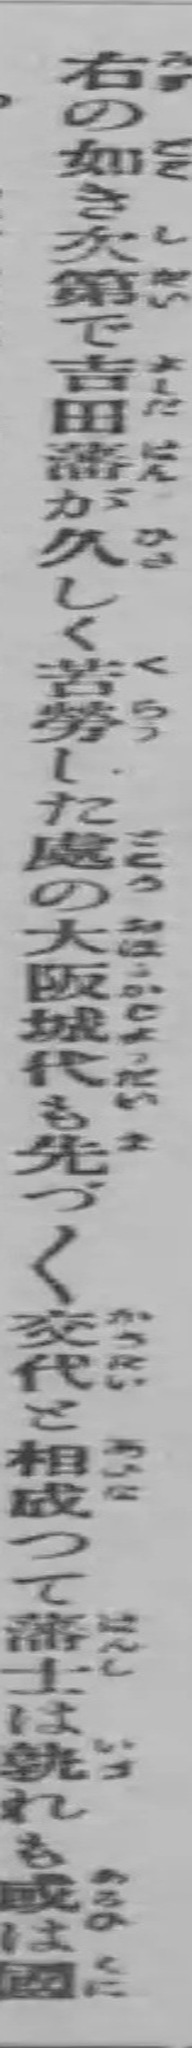右の如き次第で吉田藩が久しく苦労した処の大阪城代も先づ〳〵交代と相成つて藩士は孰れも或は国
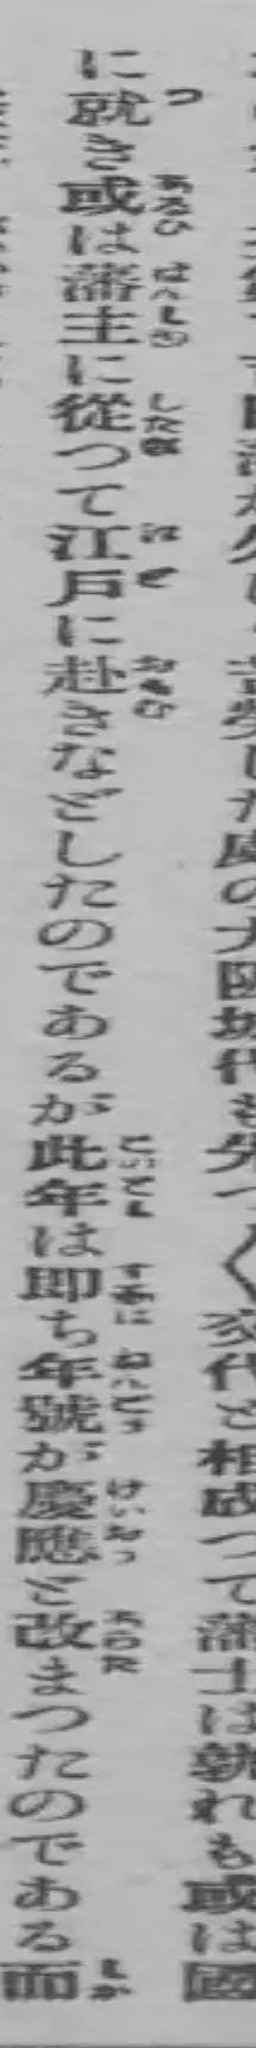に就き或は藩主に従つて江戸に赴きなどしたのであるが此年は即ち年号が慶応と改まつたのである而
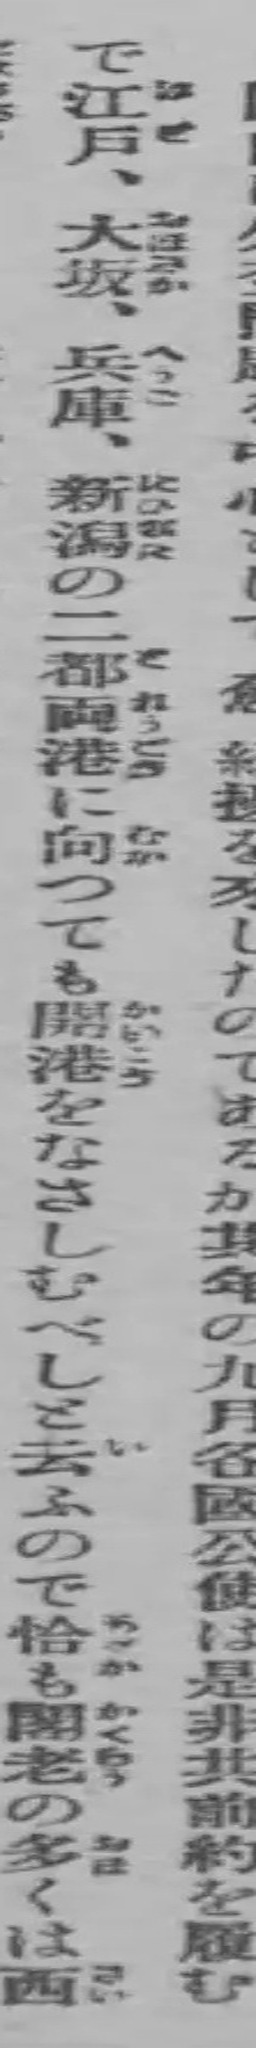で江戸、大坂、兵庫、新潟の二都両港に向つても開港をなさしむべしと云ふので恰も閣老の多くは西
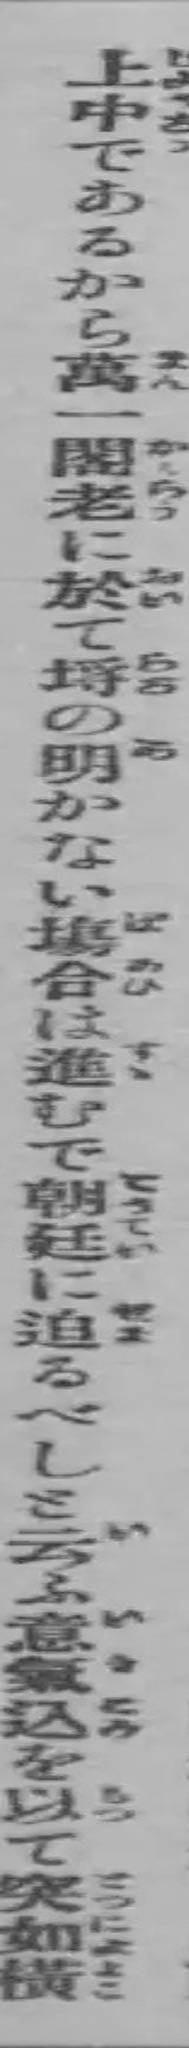上中であるから万一閣老に於て埒の明かない場合は進むで朝廷に迫るべと云ふ意気込を以て突如横

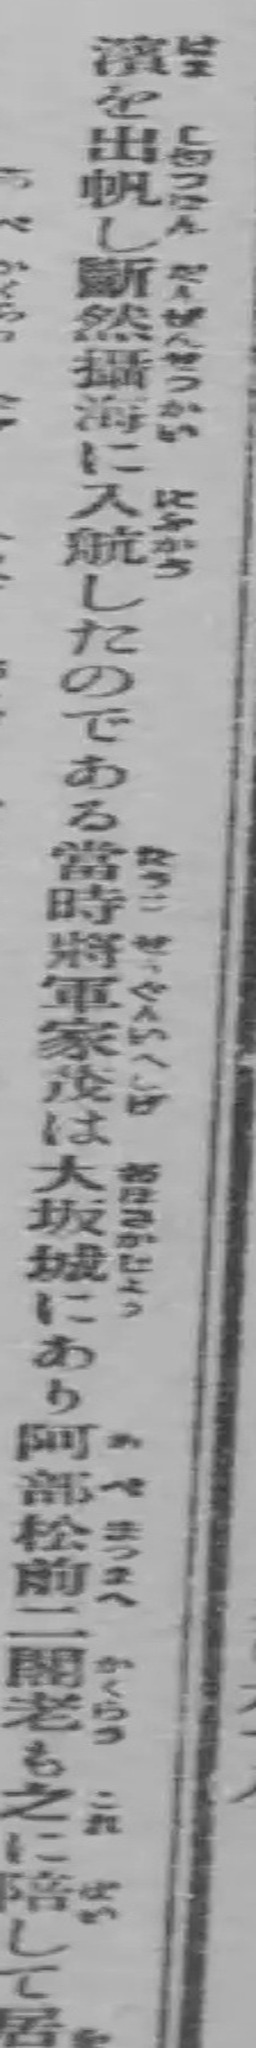浜を出帆し断然摂海に入航したのである当時将軍家茂は大坂城にあり阿部松前二閣老も之に陪して居
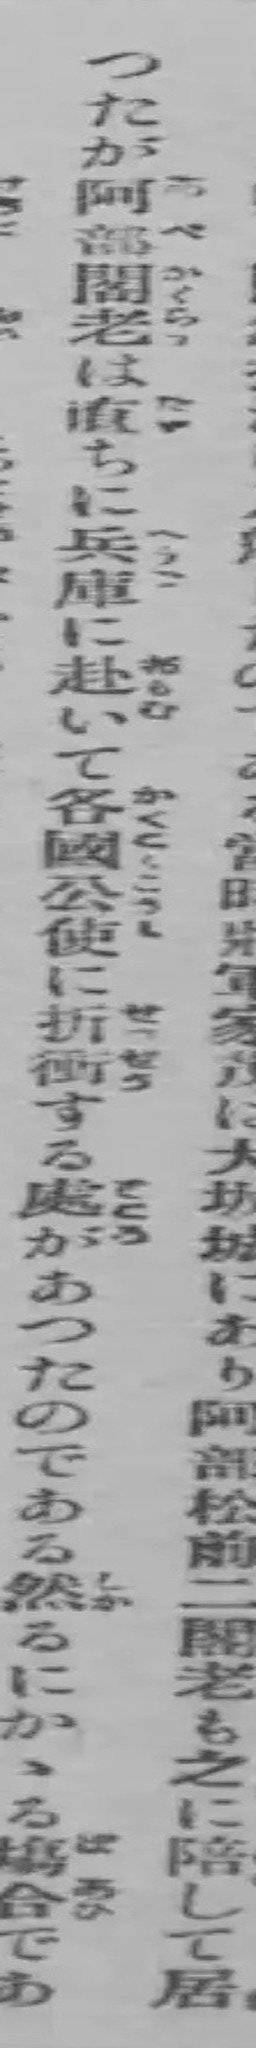つたが阿部閣老は直ちに兵庫に赴いて各国公使に折衝する処があつたのである然るにかゝる場合であ
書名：豊橋市史談
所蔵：国立国会図書館 National Diet Library, JAPAN
